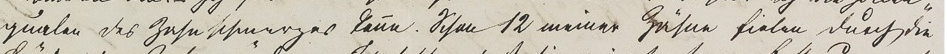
qualen des Zahnschmerzes kenne. Schon 12 meiner Zähne fielen durch die
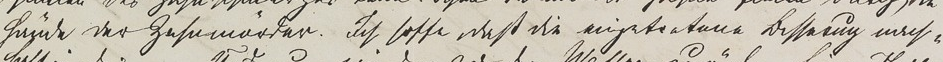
Hände der Zahnmörder. Ich hoffe, daß die eingetretene Besserung nach-
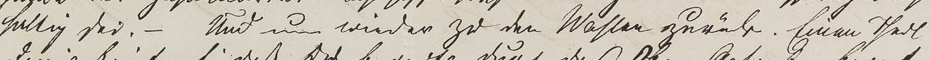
haltig sei. ­ Und nun wieder zu den Wahlen zurück. Einen Theil
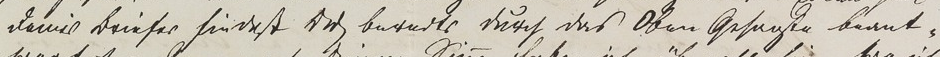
Deines Briefes findest Du bereits durch das Oben Gesagte beant-
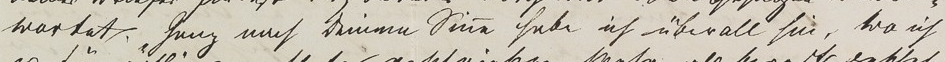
wortet. Ganz nach Deinem Sinne habe ich überall hin, wo ich
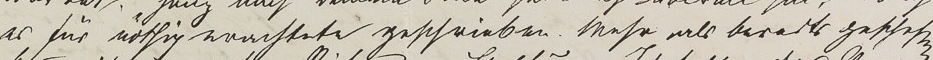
es für nöthig erachtete geschrieben. Mehr als bereits geschehen,
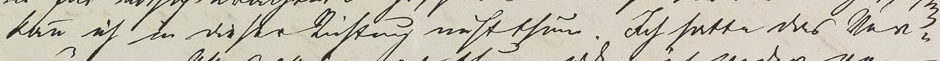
kann ich in dieser Richtung nicht thun. Ich hatte das Ver-
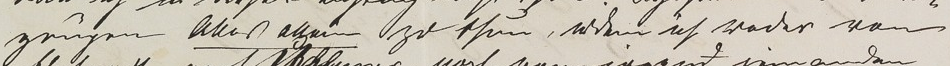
gnügenAlles allein zu thun, indem ich weder von
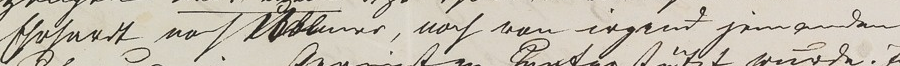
Ehrhardt noch Ullmer, noch von irgend jemanden
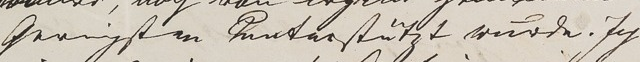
Geringsten unterstützt wurde. Ich
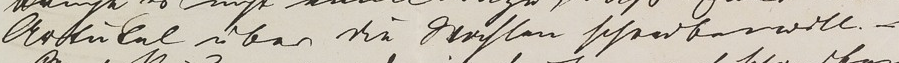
Artikel über die Wahlen schreiben will. –
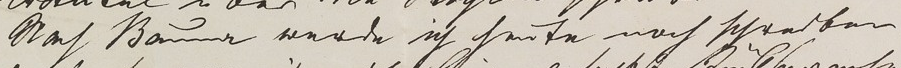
Nach Bauma werde ich heute noch schreiben
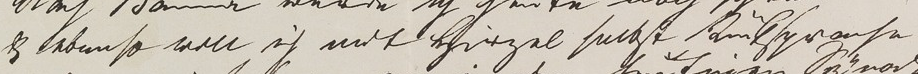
& ebenso will ich mit Hirzel selbst Rücksprache
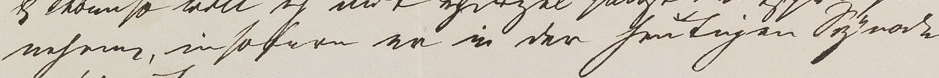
nehmen, insofern er in der heutigen Synode
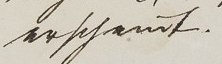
erscheint.
